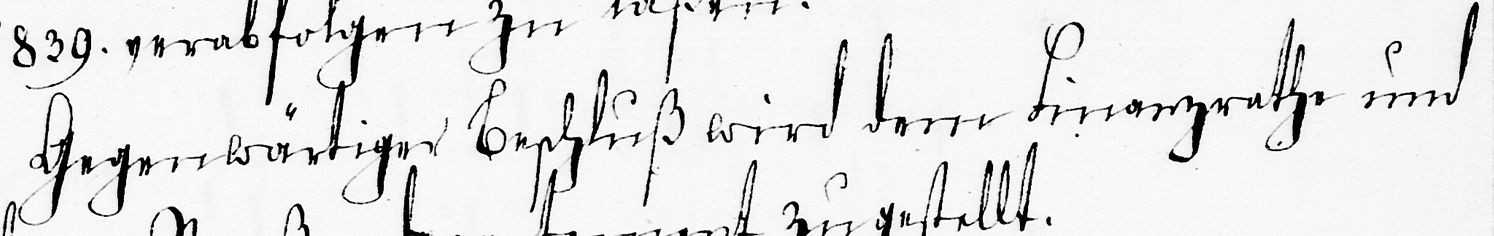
Gegenwärtiger Beschluß wird dem Finazrathe und
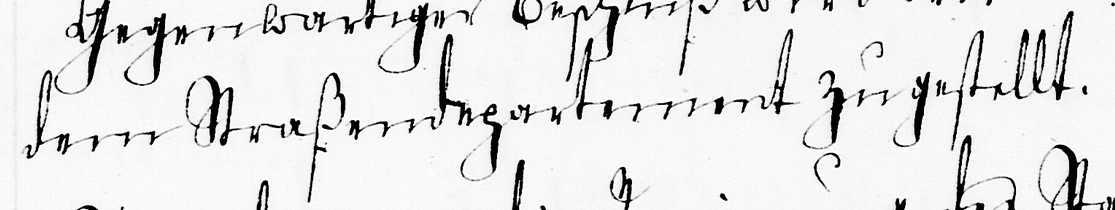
dem Straßendepartement zugestellt.
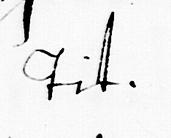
Tit.
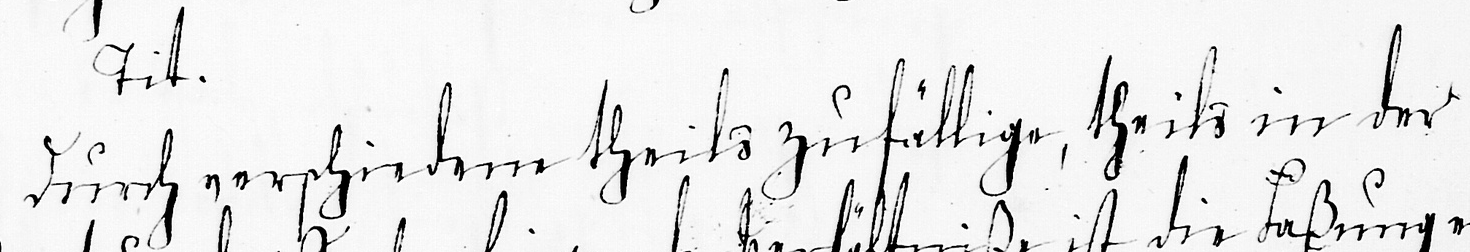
Durch verschiedene theils zufällige, theils in der
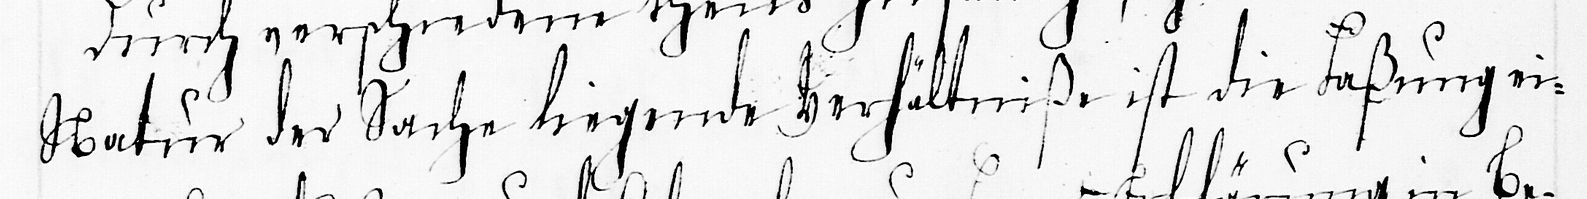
Natur der Sache liegende Verhältniße ist die Faßung ei¬
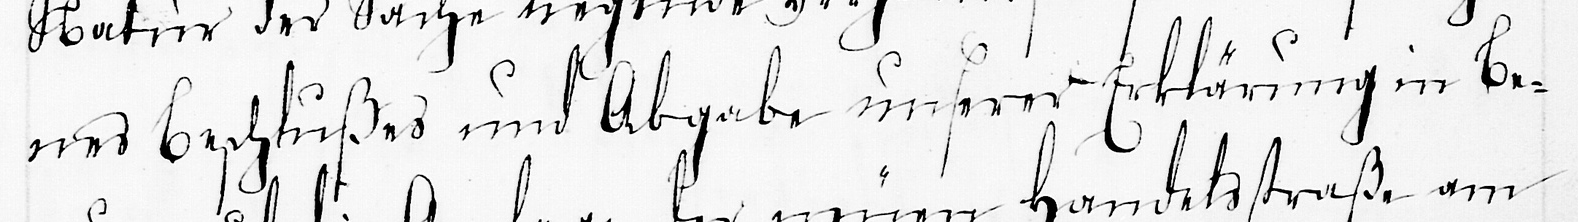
nes Beschlußes und Abgabe unserer Erklärung in Be¬
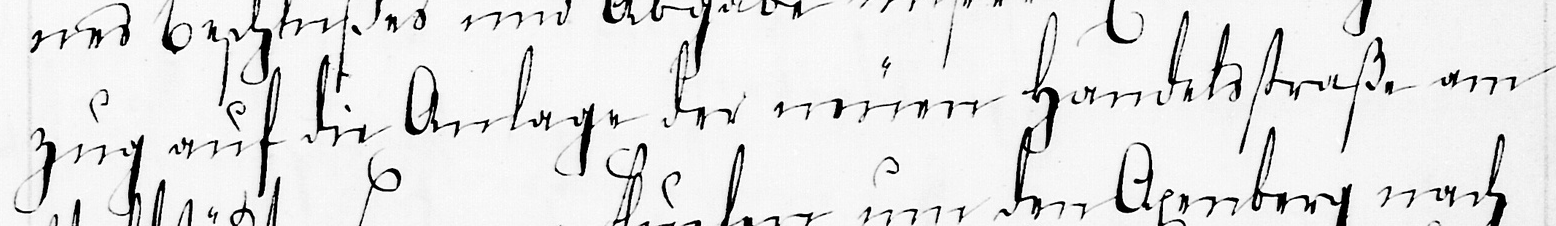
zug auf die Anlage der neuen Handelsstraße am
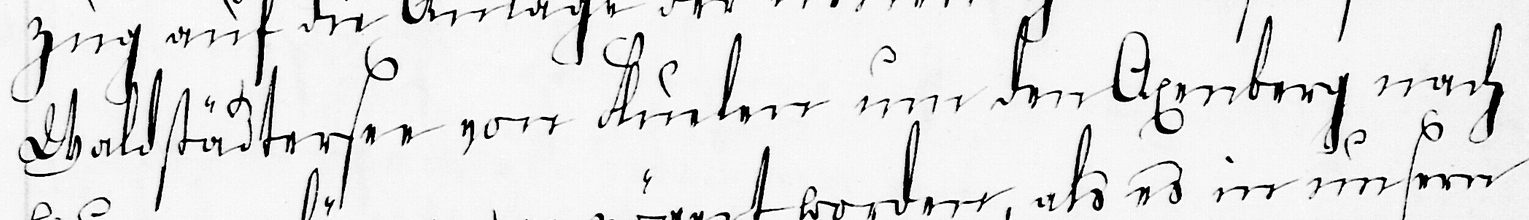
Waldstädtersee von Fluelen um den Axenberg nach
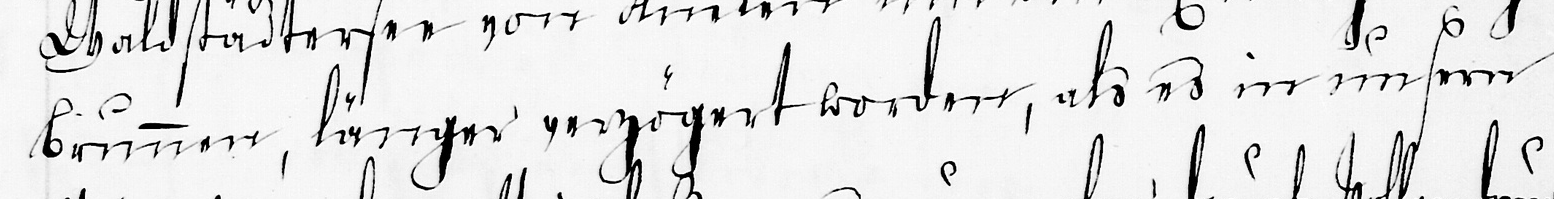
Brunnen, länger verzögert worden, als es in unsern
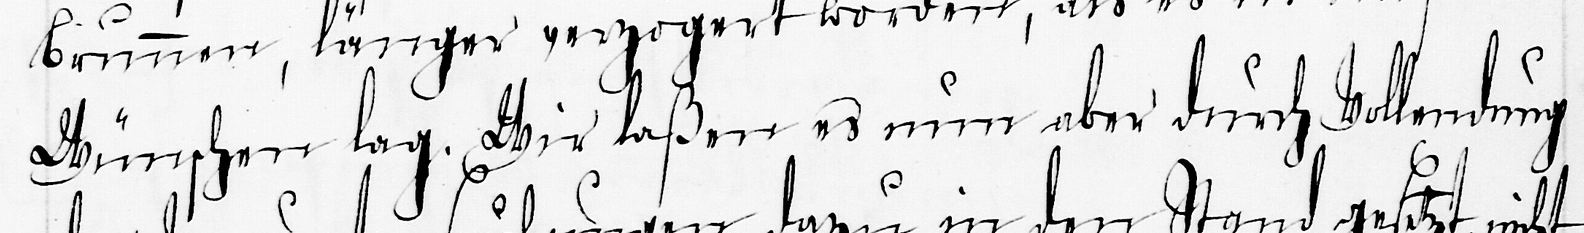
Wünschen lag. Wir laßen es nun aber durch Vollendung
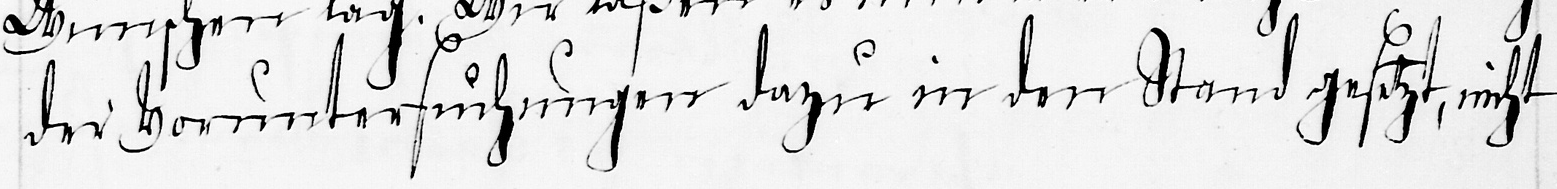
der Voruntersuchungen dazu in den Stand gesetzt, nicht
